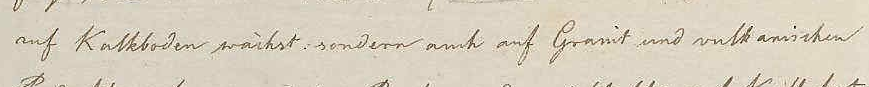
auf Kalkboden wächst: sondern auch auf Granit und vulkanischen
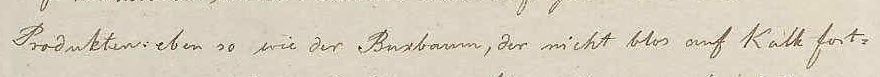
Produkten: eben so wie der Buxbaum, der nicht blos auf Kalk fort-
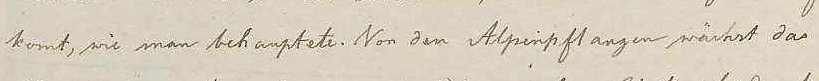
komt, wie man behauptete. Von den Alpenpflanzen wächst das
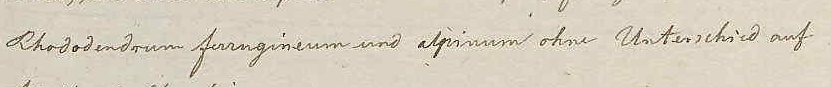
Rhododendrum ferrugineum und alpinum ohne Unterschied auf
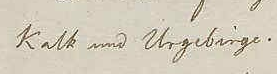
Kalk und Urgebirge.
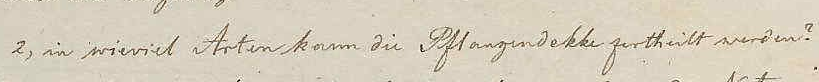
2, in wieviel Arten kann die Pflanzendekke zertheilt werden?
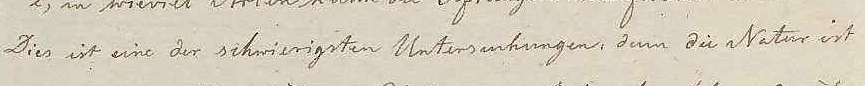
Dies ist eine der schwierigsten Untersuchungen: denn die Natur ist
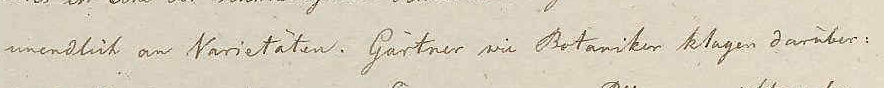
unendlich an Varietäten. Gärtner wie Botaniker klagen darüber:
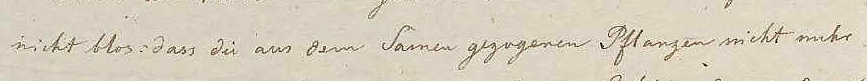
nicht blos: dass die aus dem Samen gezogenen Pflanzen nicht mehr
